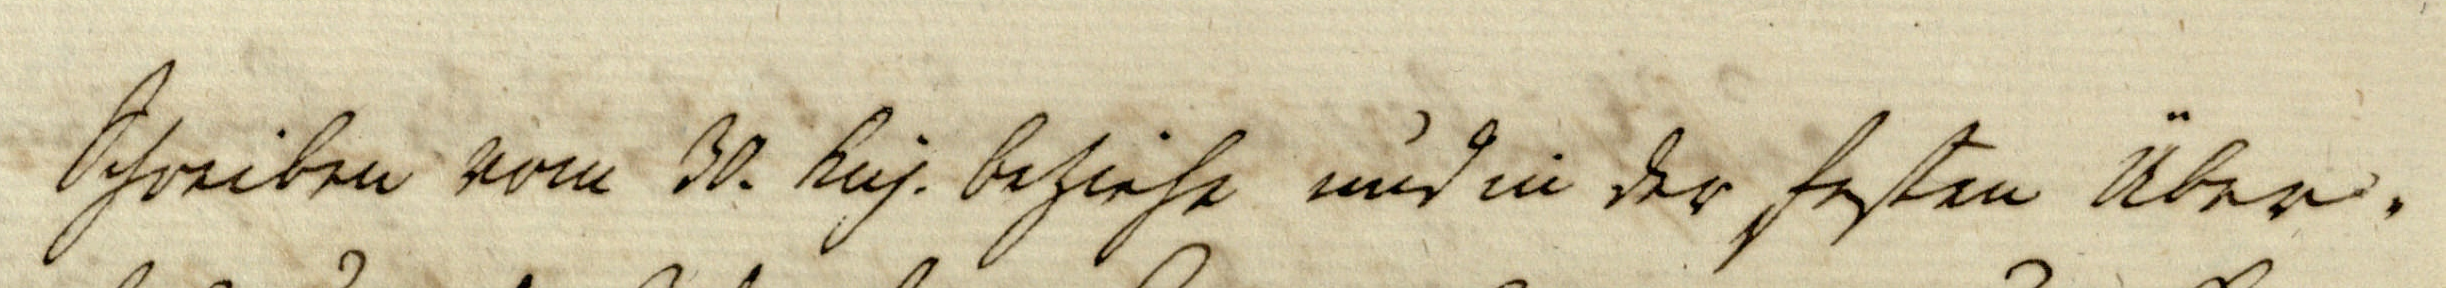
Schreiben vom 30. huj. beziehe und in der festen Über¬
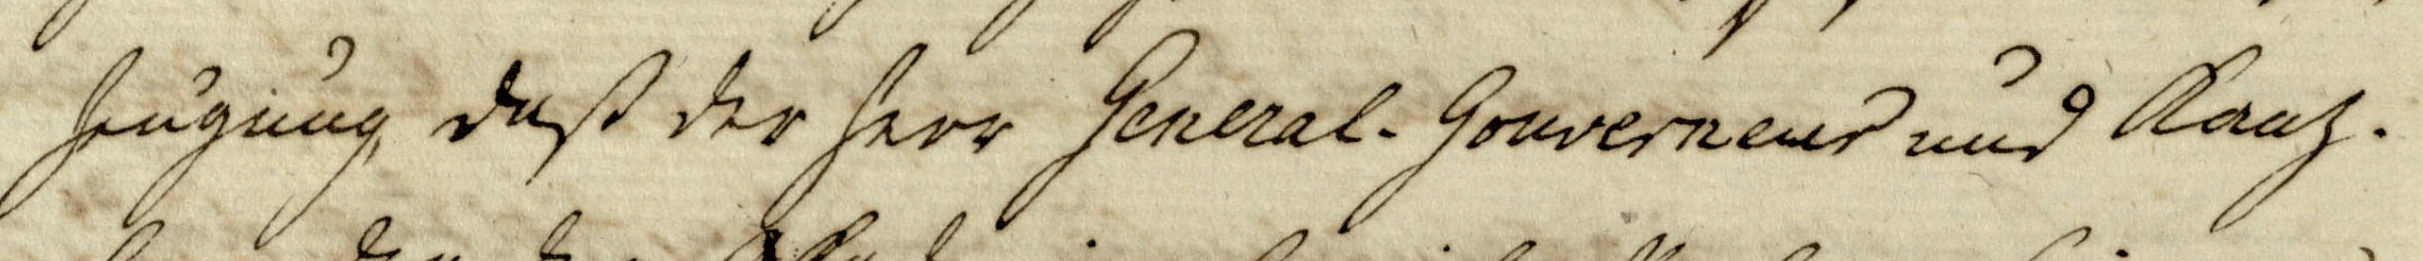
zeugung, daß der Herr General- Gouverneur und Kanz¬
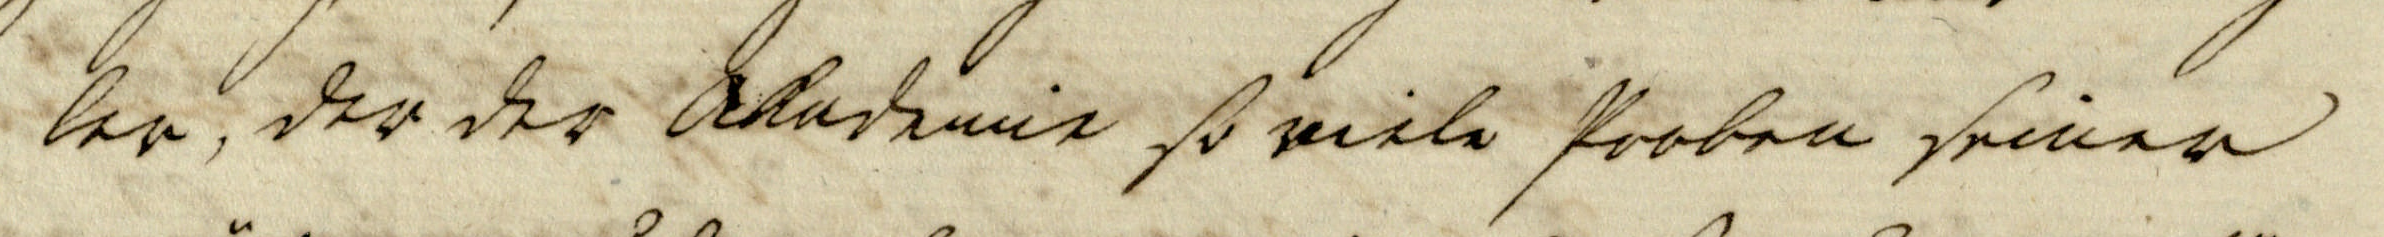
ler, der der Akademie so viele Proben seiner
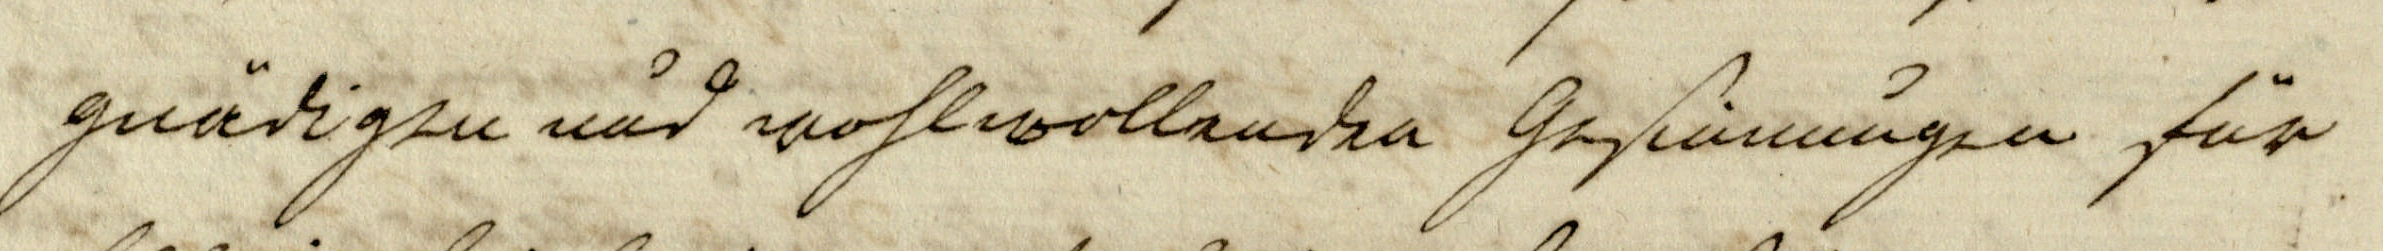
gnädigen und wohlwollenden Gesinnungen für
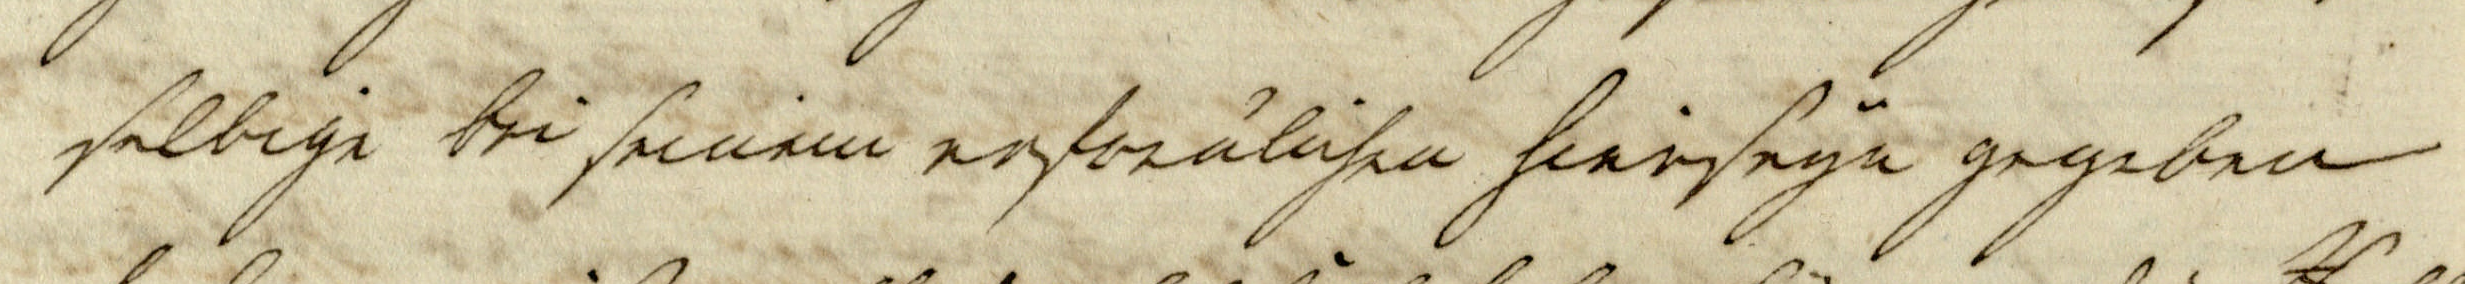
selbige bei seinem erfreulichen Hierseÿn gegeben
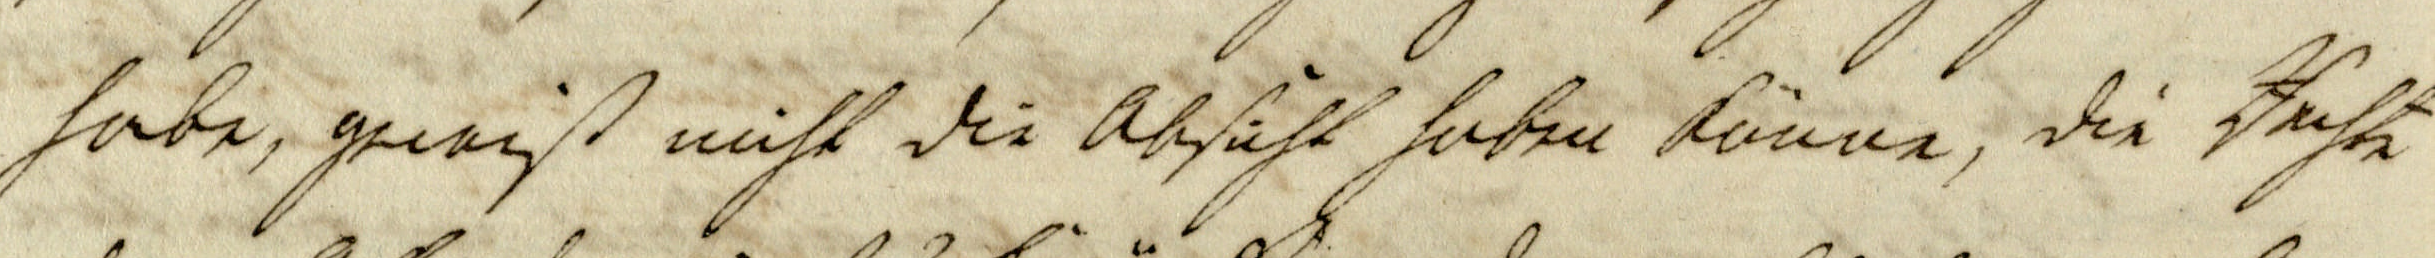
habe, gewiß nicht die Absicht haben könne, die Rechte
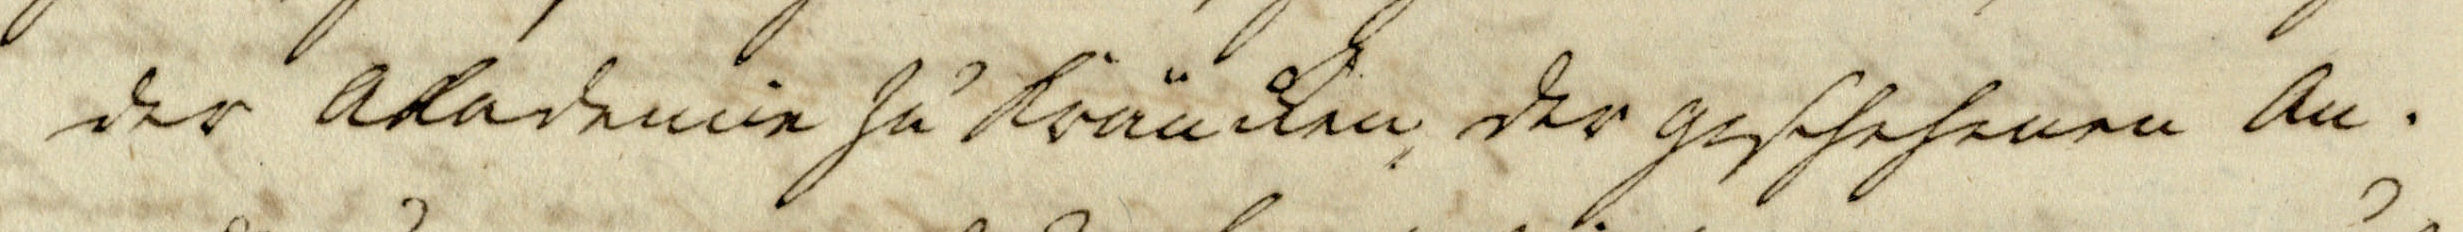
der Akademie zu kräncken, der geschehenen An¬
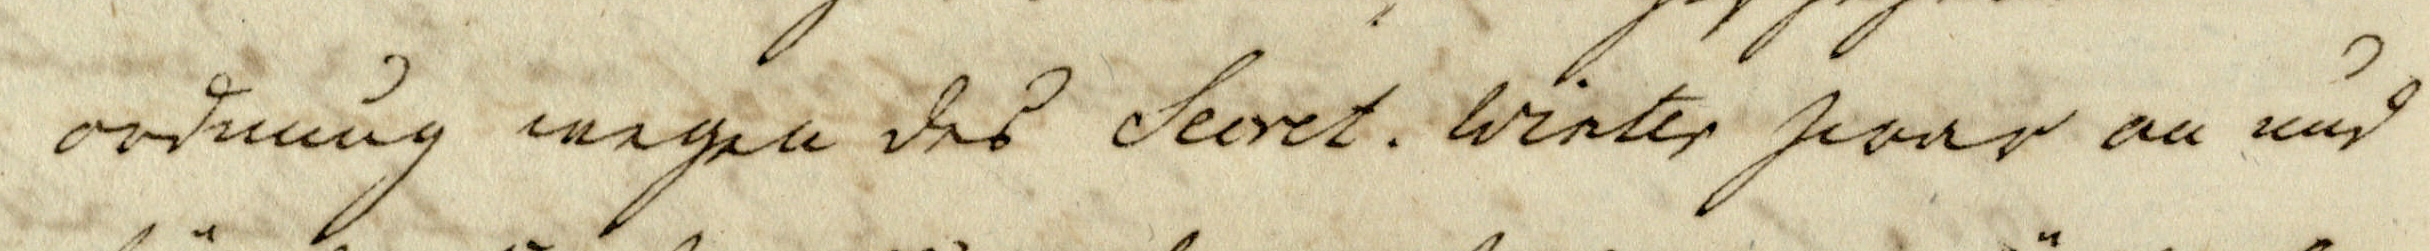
ordnung wegen des Secret. Winter zwar an und
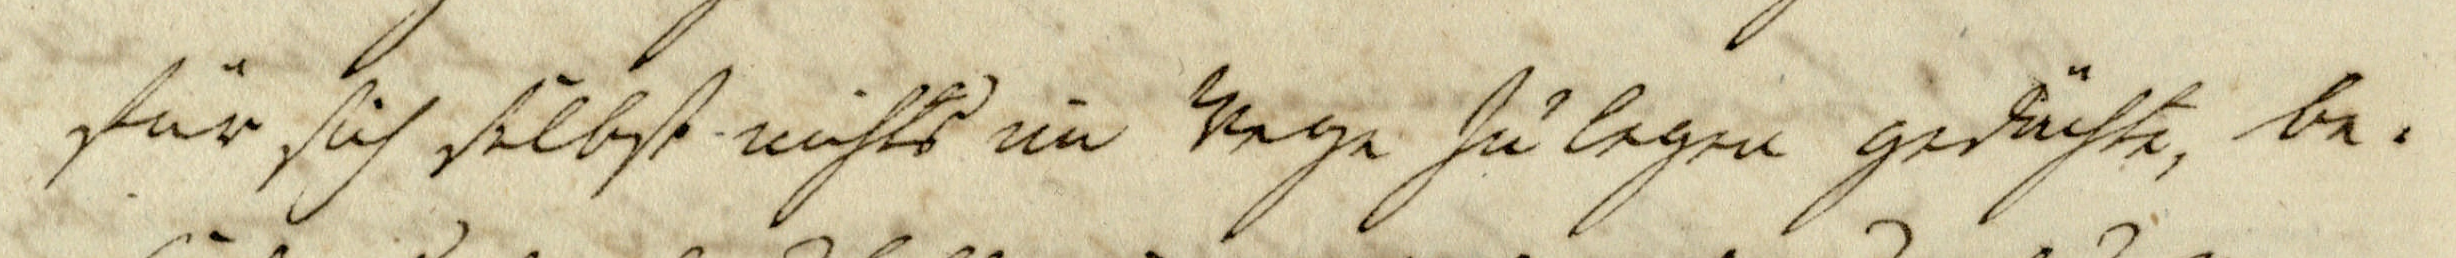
für sich selbst nichts im Wege zu legen gedächte, be¬
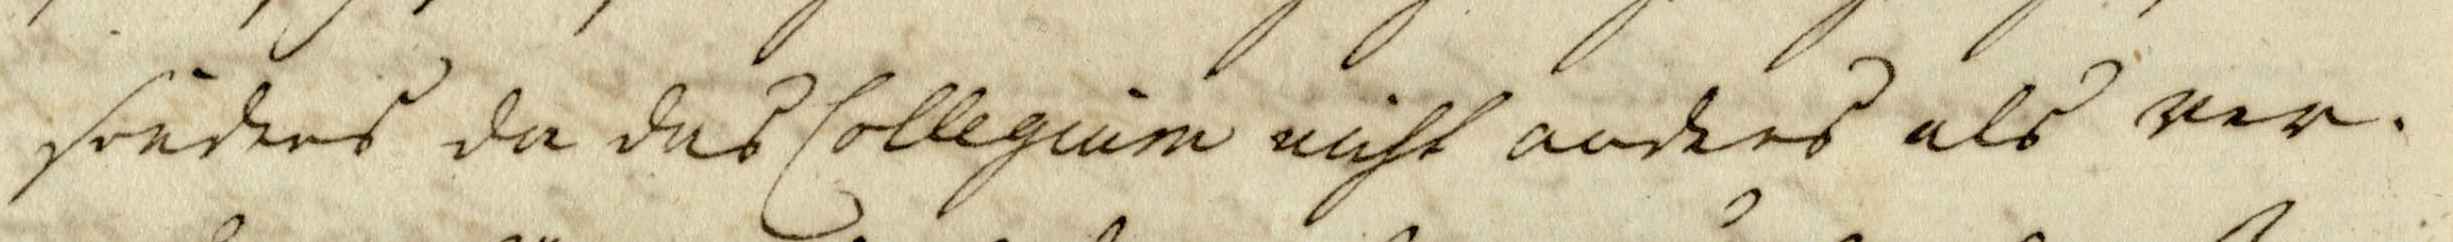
sonders da das Collegium nicht anders als ver¬
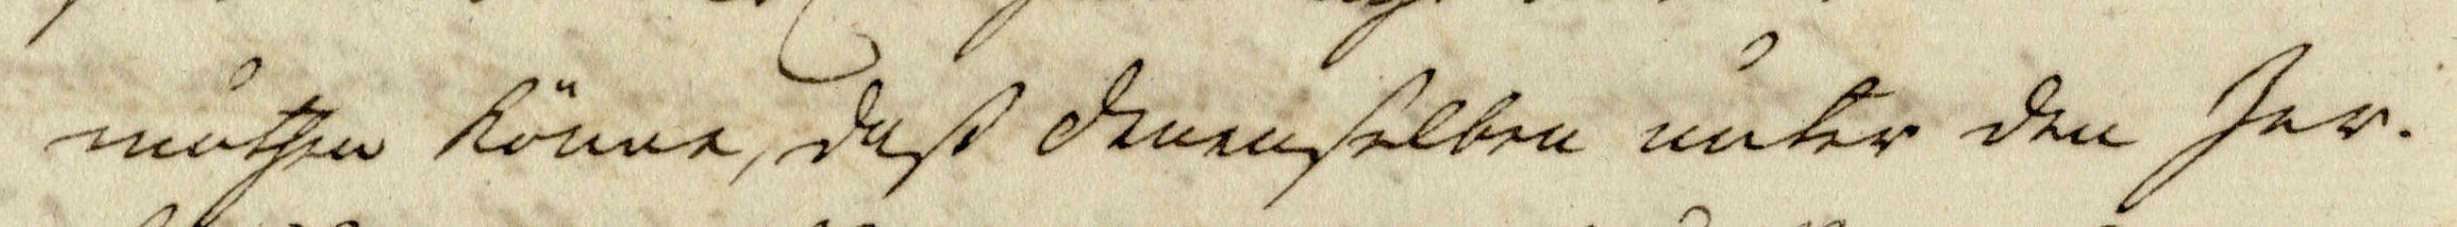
muthen könne, daß Denenselben unter den Zer¬
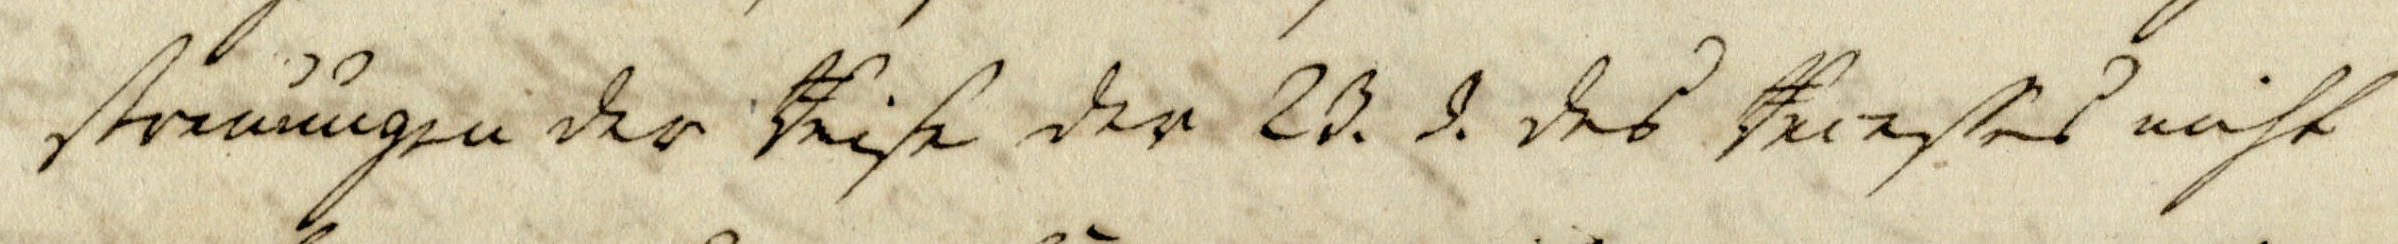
streuungen der Reise der 23. §. des Recesses nicht
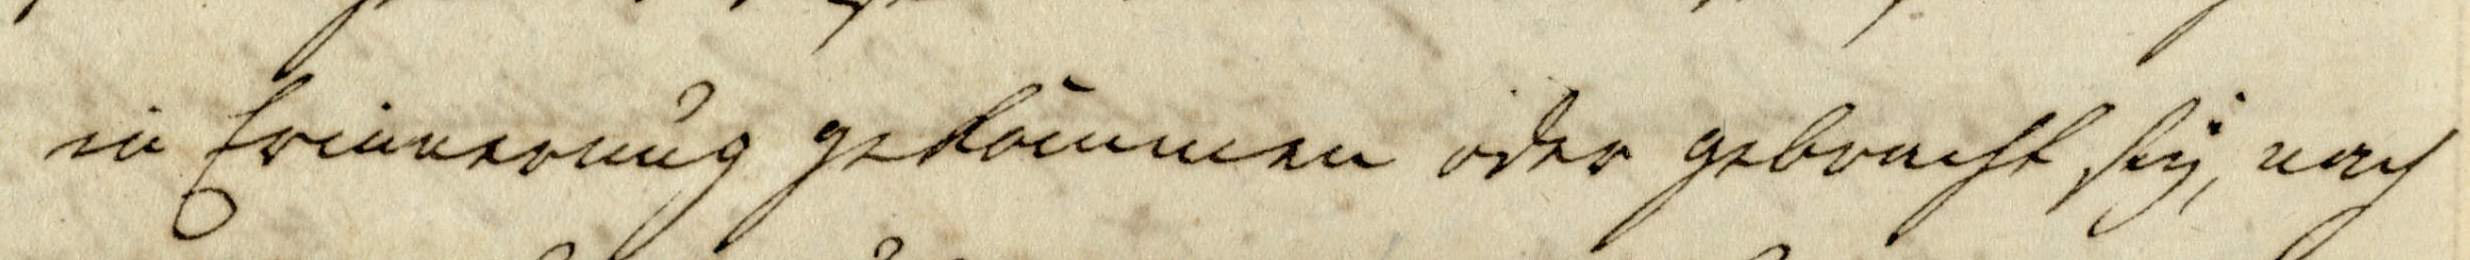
in Erinnerung gekommen oder gebracht seÿ, nach
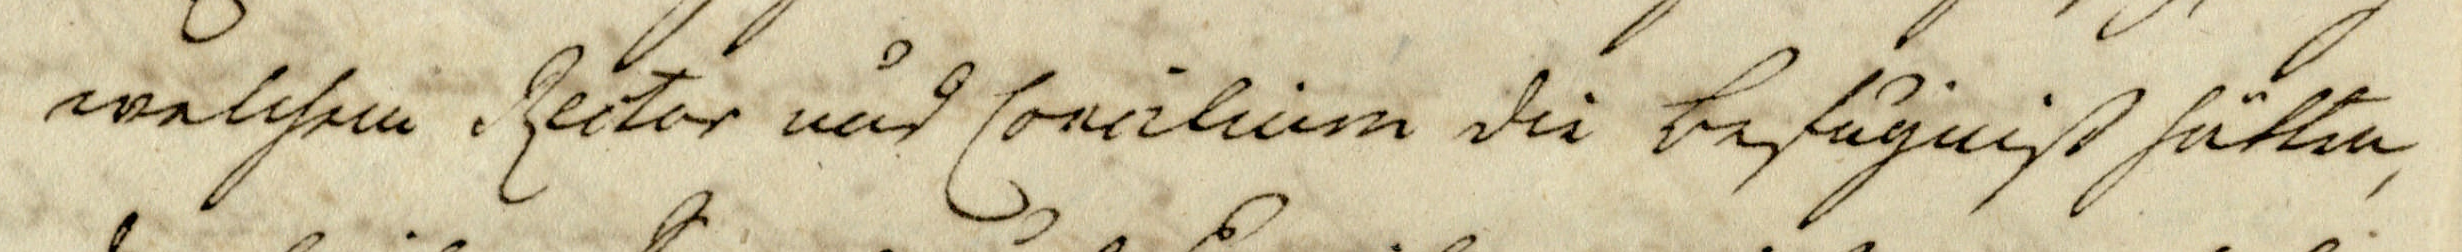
welchem Rector und Concilium die Befugniß hätten,
